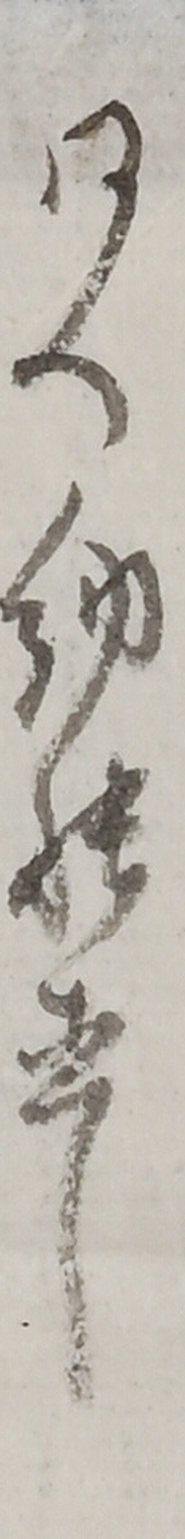同人納帳直し
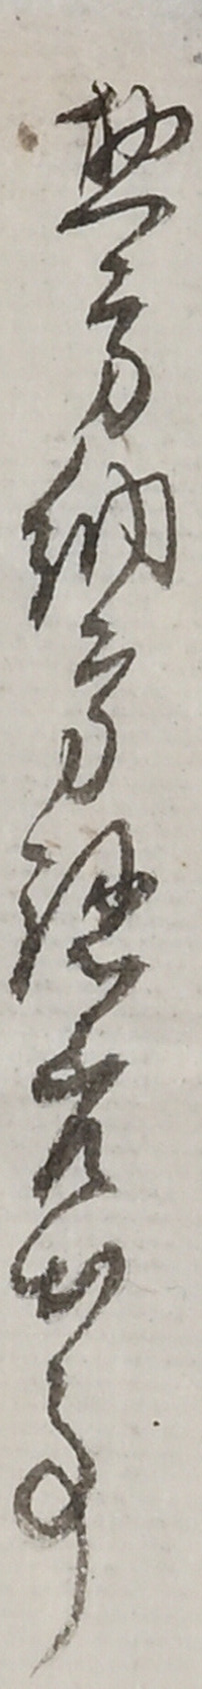惣方納方認差出事
